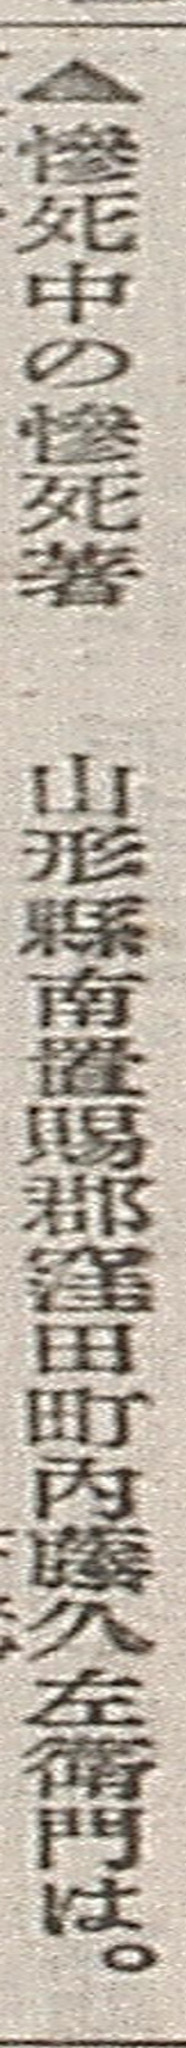▲惨死中の惨死者山形県南置賜郡窪田町内藤久左衛門は。
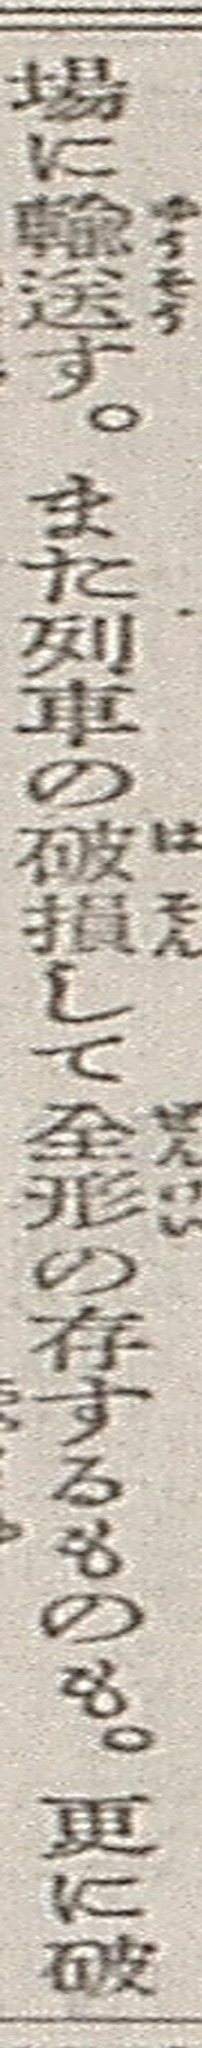場に輸送す。また列車の破損して全形の存するものも。更に破
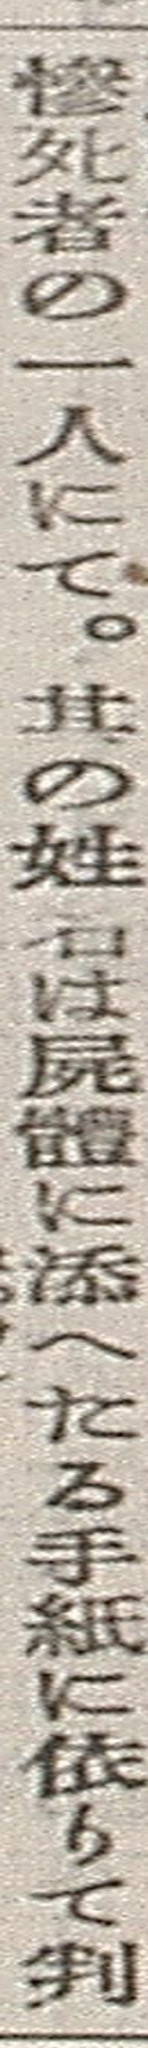惨死者の一人にて。其の姓名は屍体に添へたる手紙に依りて判
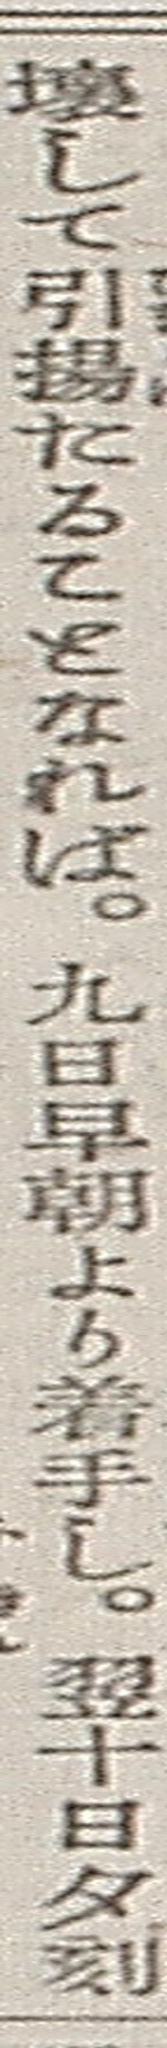壊して引揚たることなれば。九日早朝より着手し。翌十日夕刻
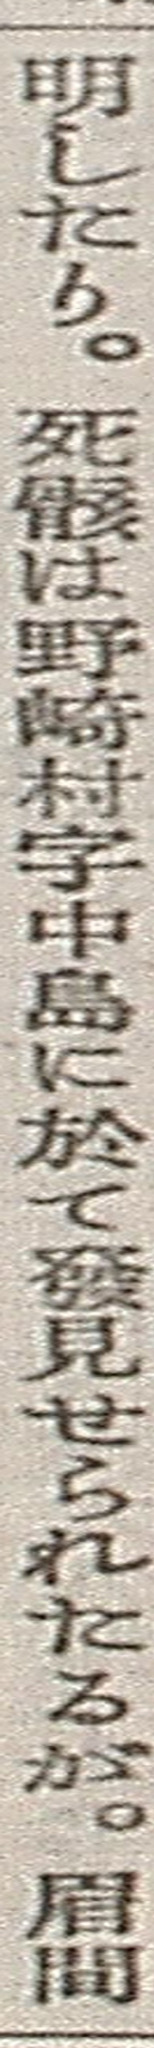明したり。死骸は野崎村字中島に於て発見せられたるが。眉間
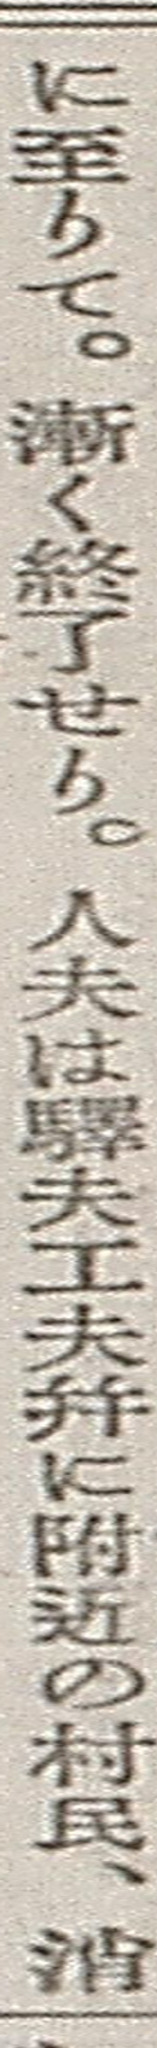に至りて。漸く終了せり。人夫は駅夫工夫并に附近の村民、消
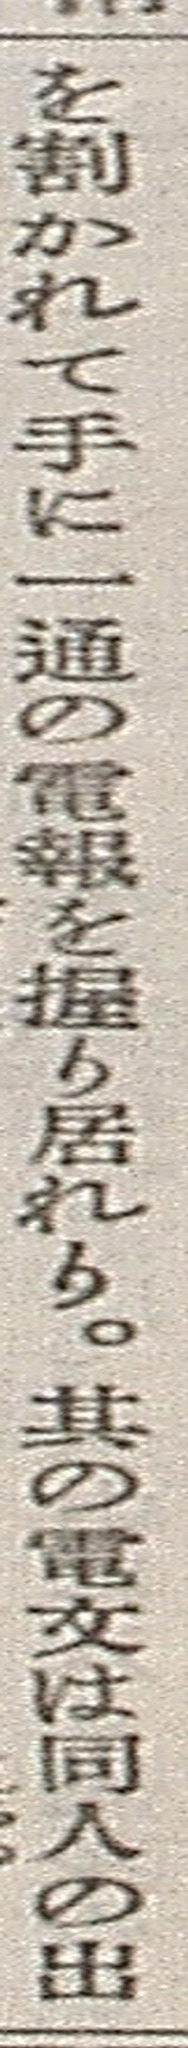を割かれて手に一通の電報を握り居れり。其の電文は同人の出
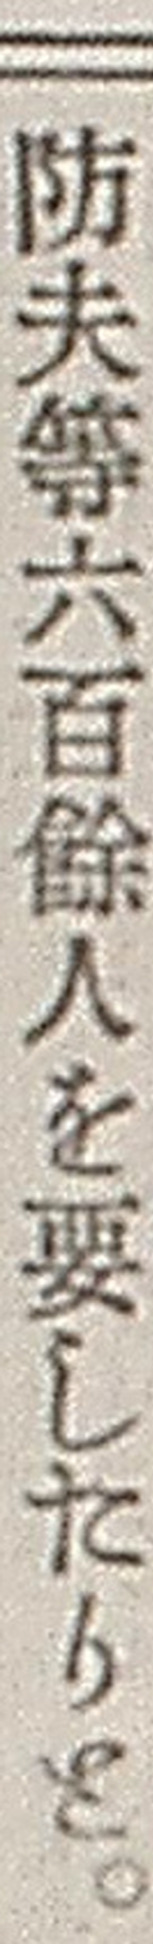防夫等六百余人を要したりと。
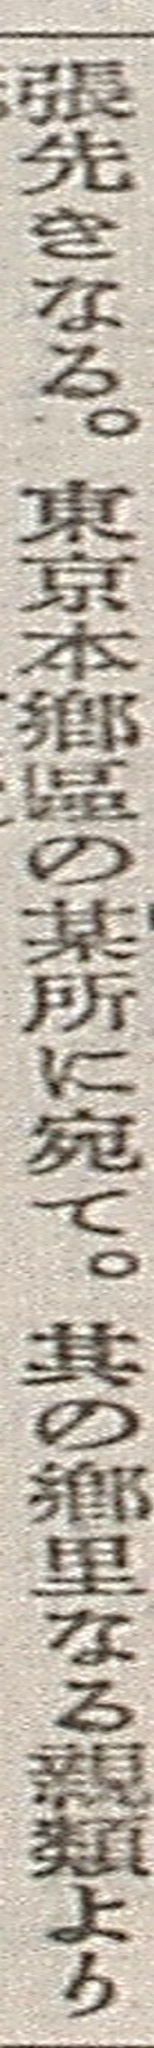張先きなる。東京本郷区の某所に宛て。其の郷里なる親類より
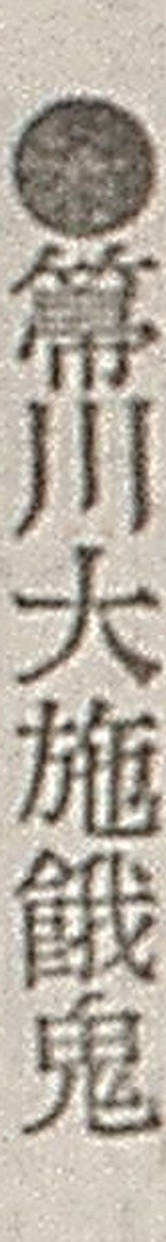●箒川大施餓鬼
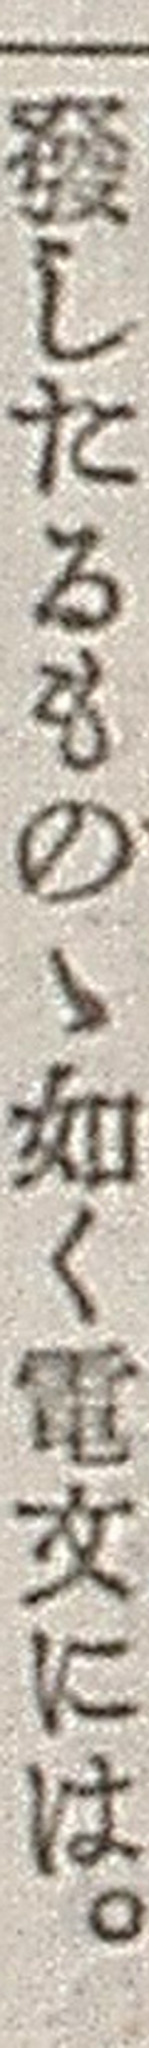発したるものゝ如く電文には。
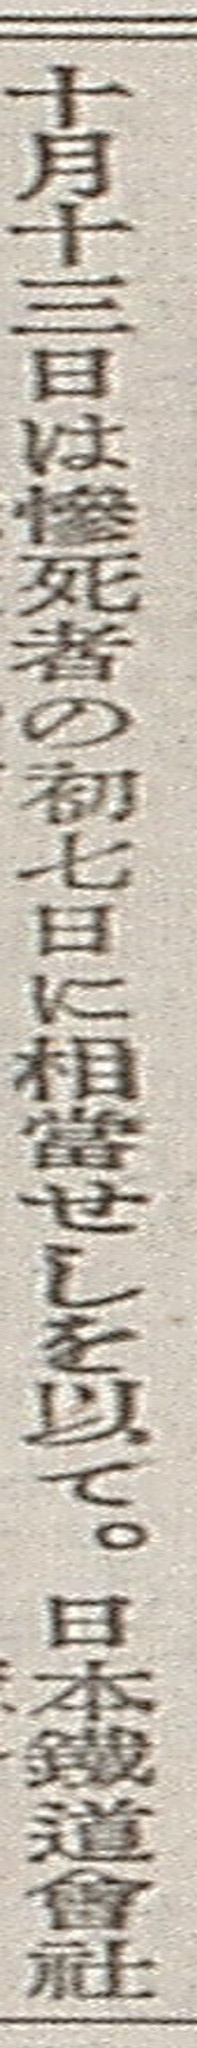十月十三日は惨死者の初七日に相当せしを以て。日本鉄道会社
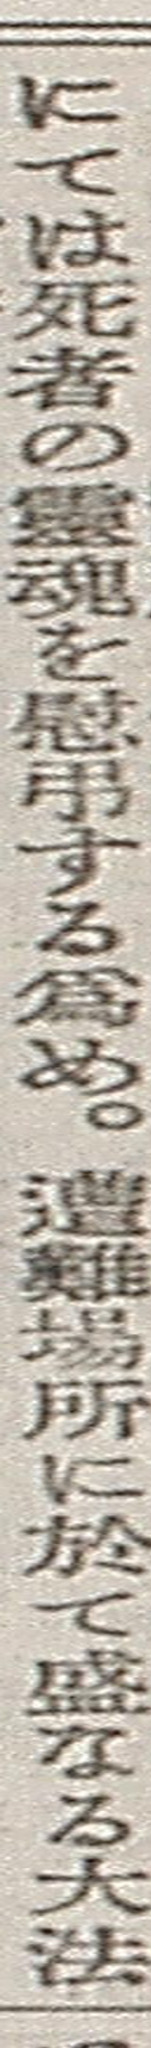にては死者の霊魂を慰弔する為め。遭難場所に於て盛なる大法
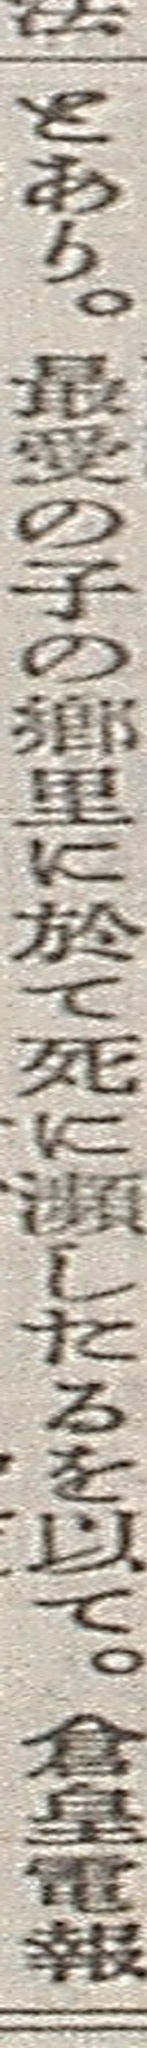とあり。最愛の子の郷里に於て死に瀕したるを以て。倉皇電報
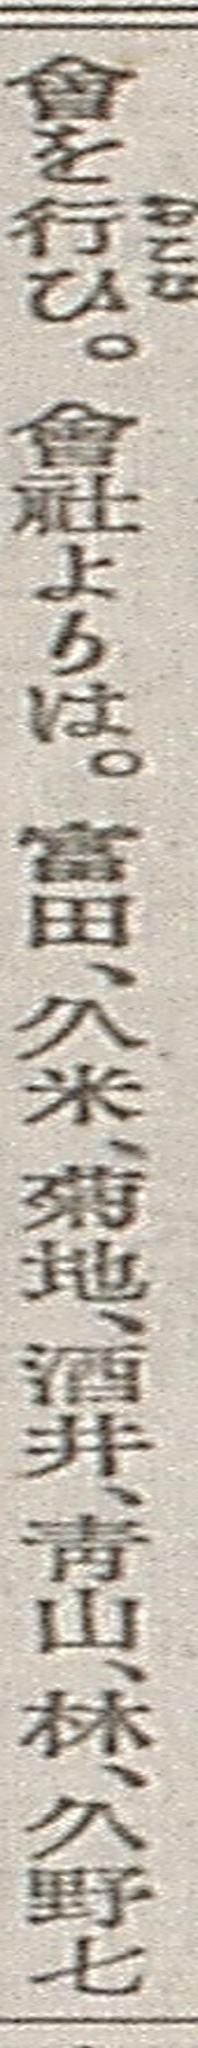会を行ひ。会社よりは。富田、久米、菊地、酒井、青山、林、久野七
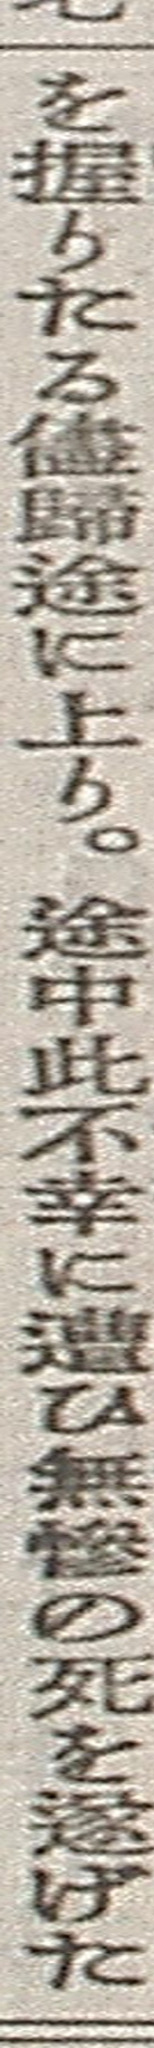を握りたる侭帰途に上り。途中此不幸に遭ひ無惨の死を遂げた
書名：風俗畫報臨時増刊第百九十九號　明治三十二年十月各地災害圖會（前編之續）
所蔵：東京大学地震研究所図書室 Earthquake Research Institute Library, The University of Tokyo, JAPAN
